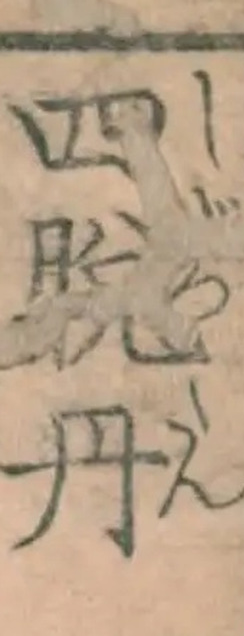四脱丹
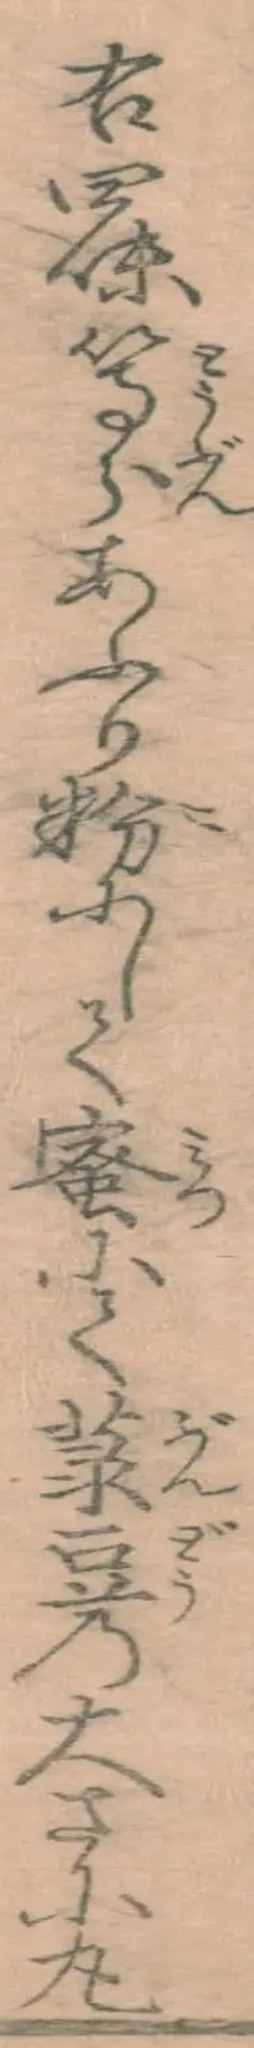右四味等分あふり粉にして蜜にて菉豆の大さに丸
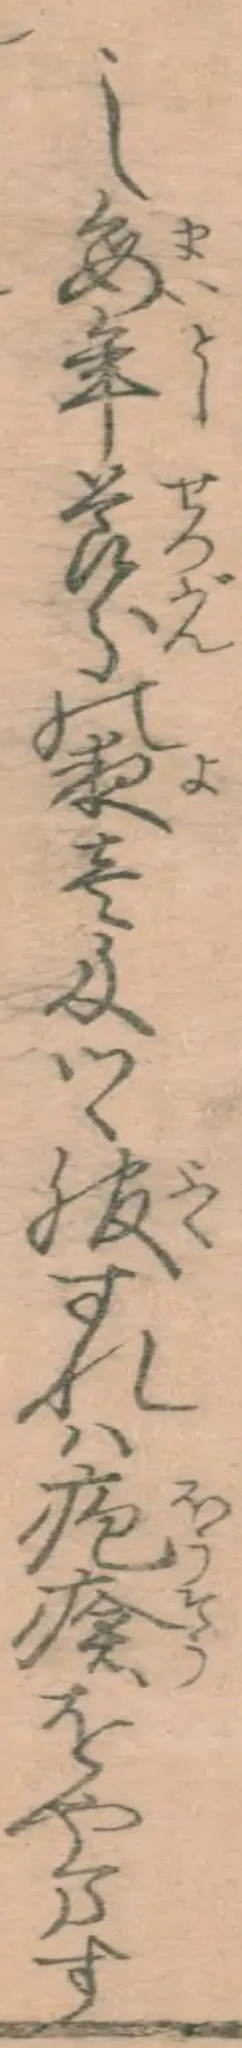し毎年節分の夜壱匁つゝ服すれは疱瘡をやます
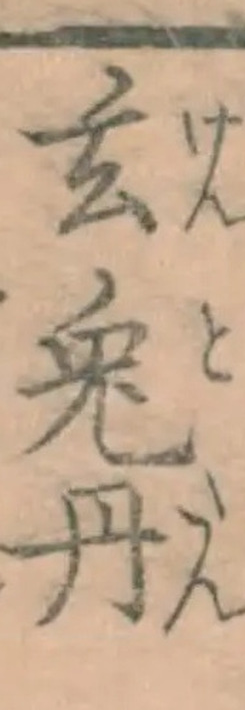玄兎丹
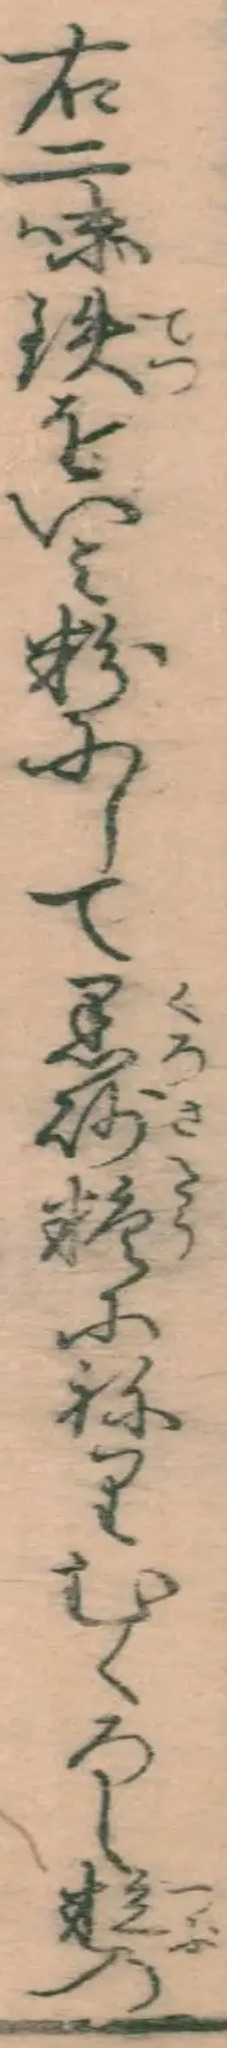右二味鉄をいみ粉にして黒砂糖にねりむくろし粒の
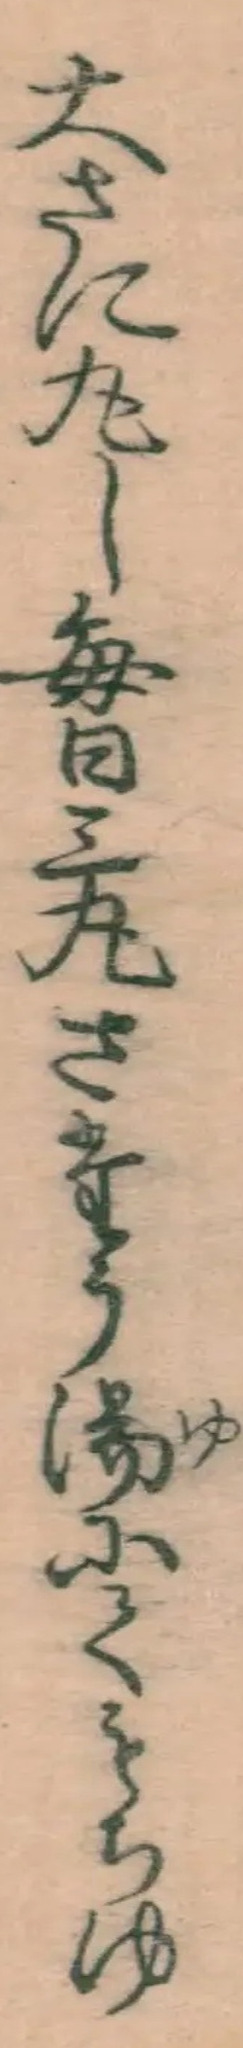大さに丸し毎日三丸さたう湯にてもちゆ
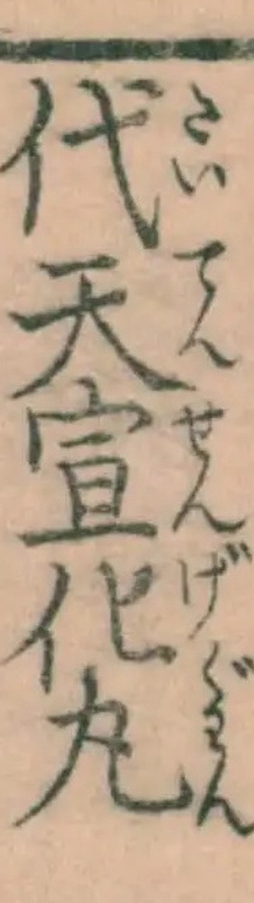代天宣化丸

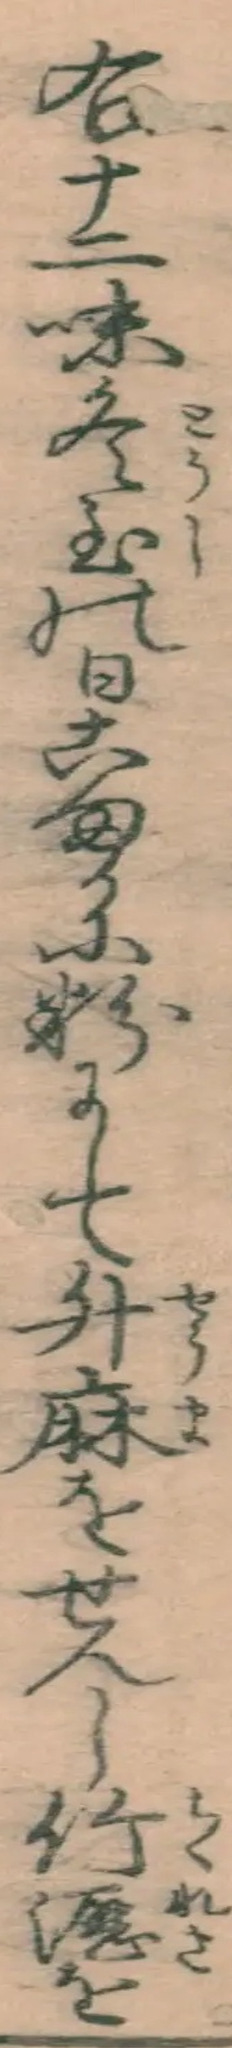右十二味冬至の日こまかに粉にして升麻をせんし竹瀝を
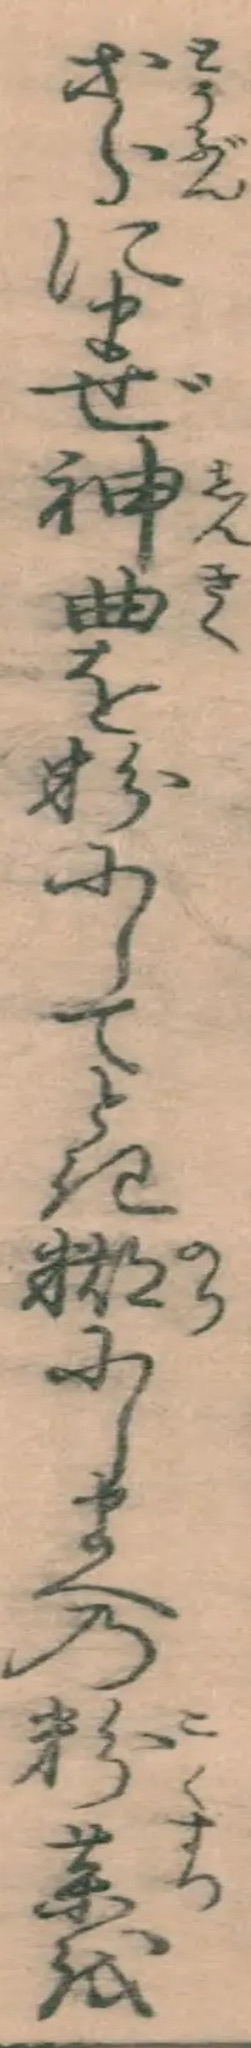等分にまぜ神曲を粉にしてとき糊にしまへの粉薬を
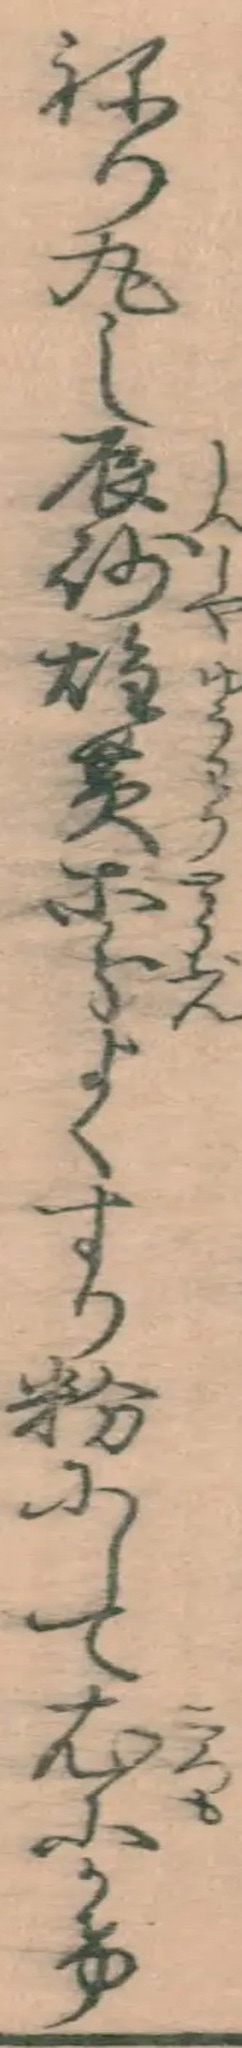ねり丸し辰砂雄黄等分よくすり粉にして衣にかけ
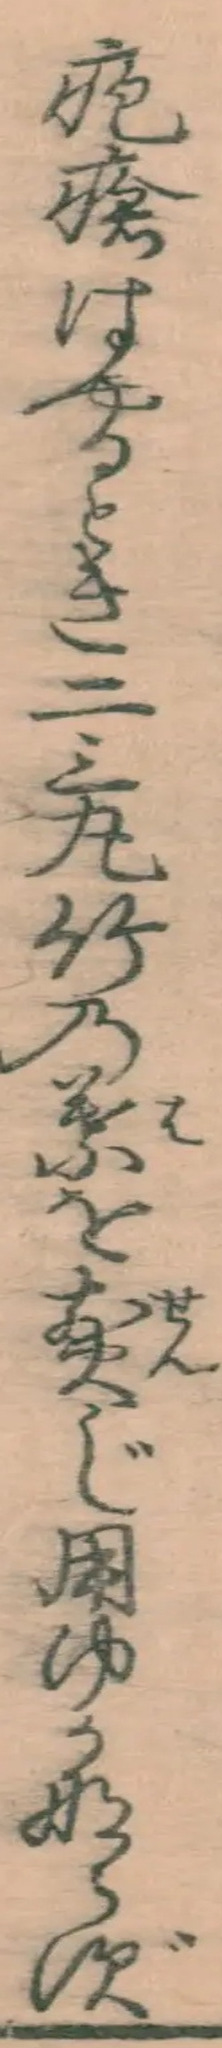疱瘡はゆるとき二三丸竹の葉を煎じ用ゆかならず
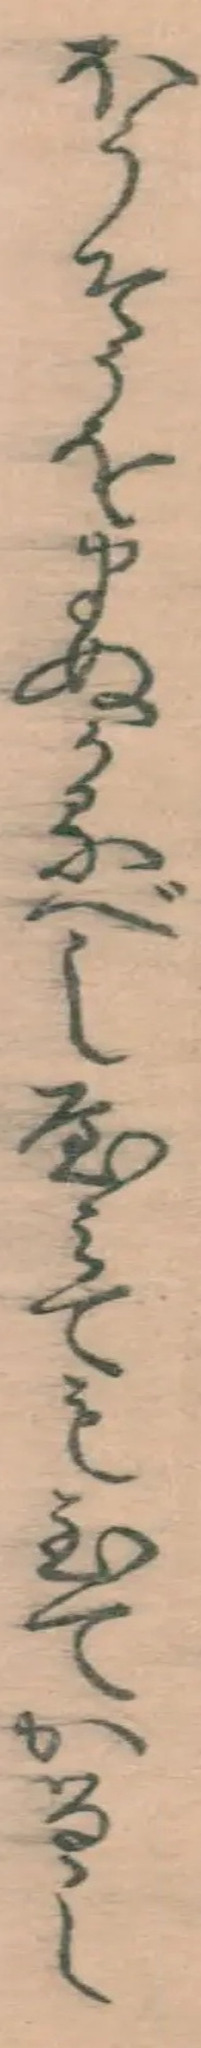ほうそうをまぬかるべしやみても至てかるし
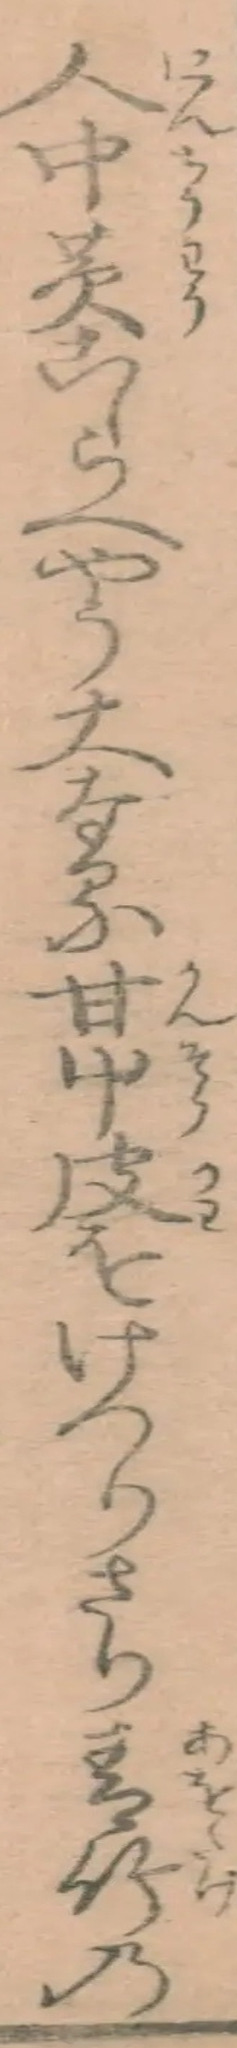人中黄こしらへやう大なる甘屮皮をけつりさり青竹の
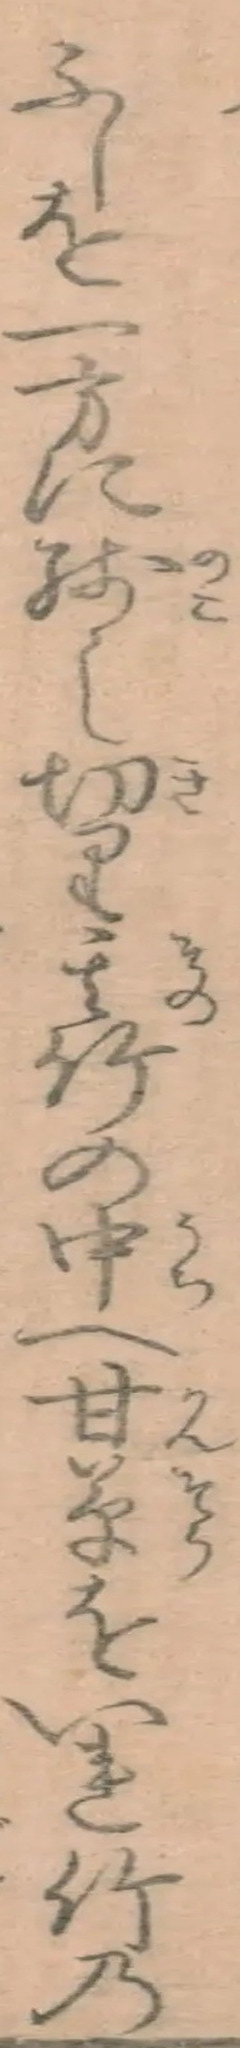ふしを一方に残し切り其竹の中へ甘草をいれ竹の
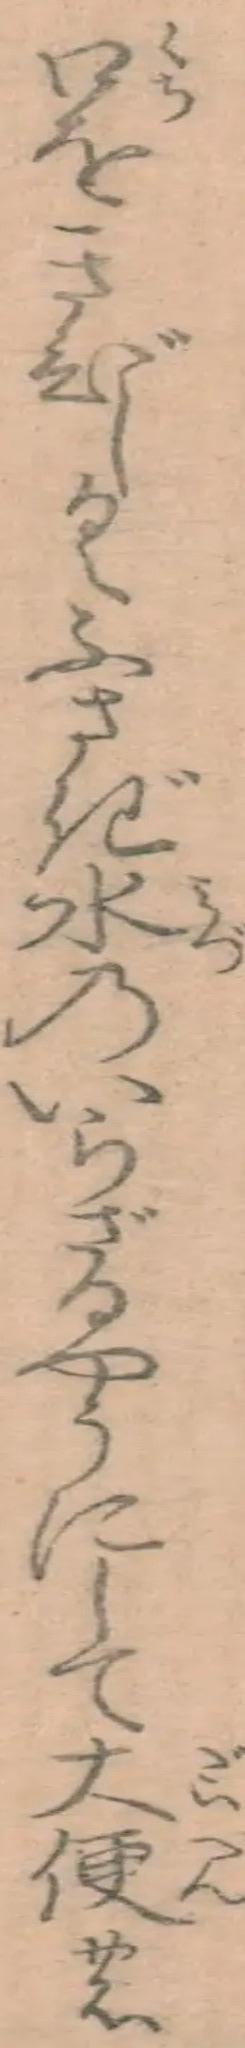口をきびしくふさぎ水のいらざるやうにして大便の
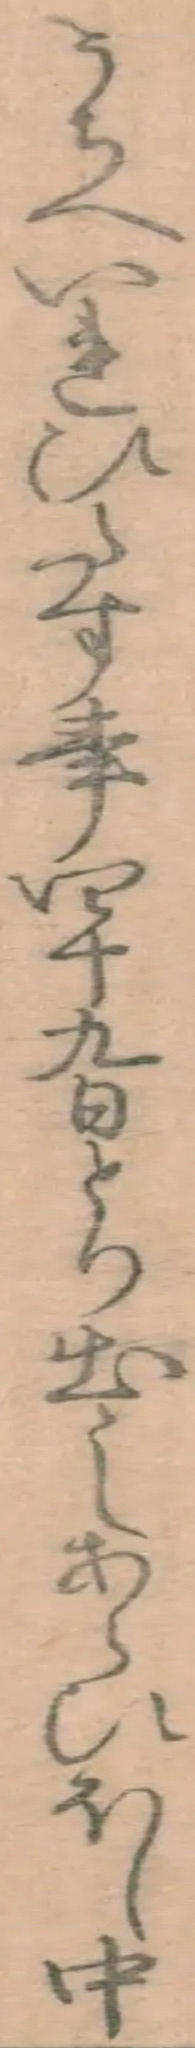うちへいれひたす事四十九日とり出しあらひほし中
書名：雨夜談
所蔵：国立国会図書館 National Diet Library, JAPAN
